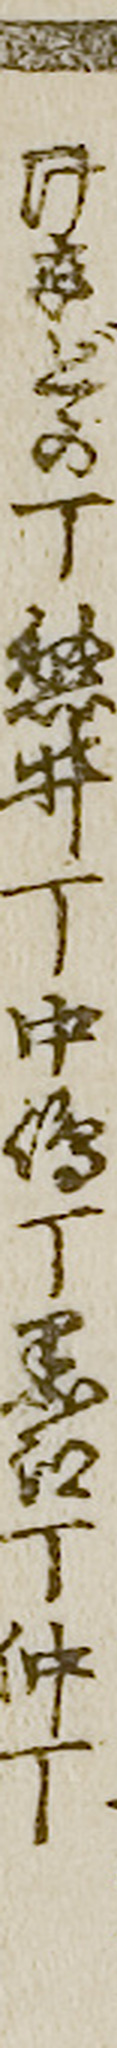けきどの丁熊井丁中島町黒江丁仲丁
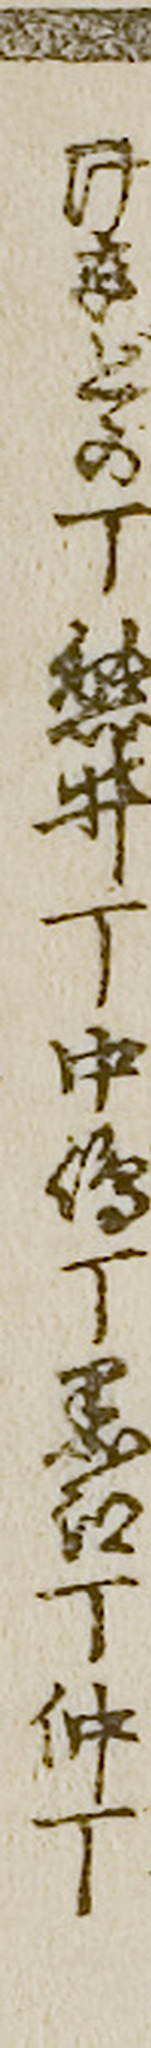けきどの丁熊井丁中島町黒江丁仲丁
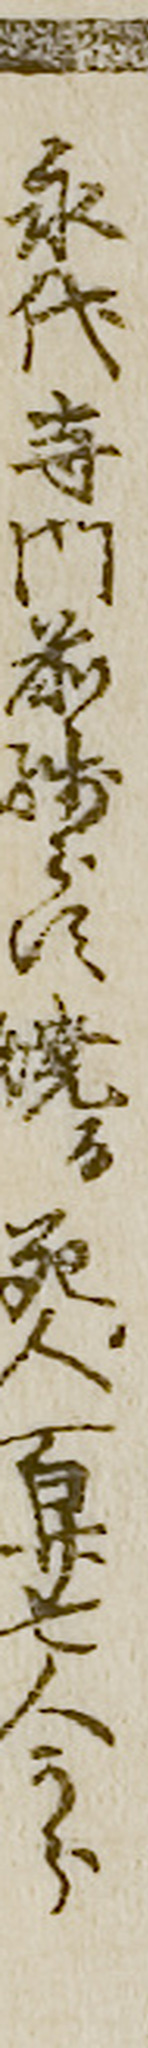永代寺門前残らず焼る死人百廿七人うら
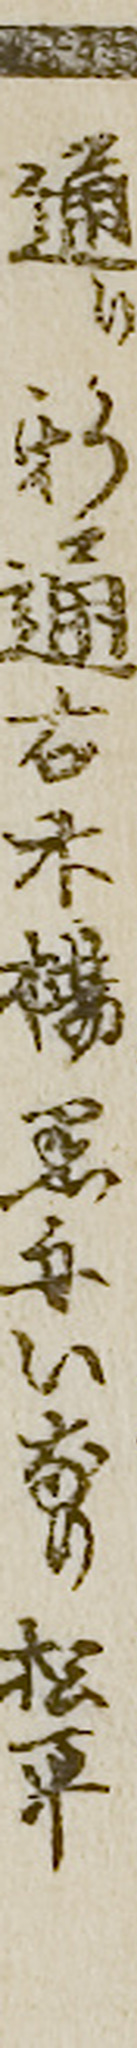通り新通右木場黒舟いなり松平
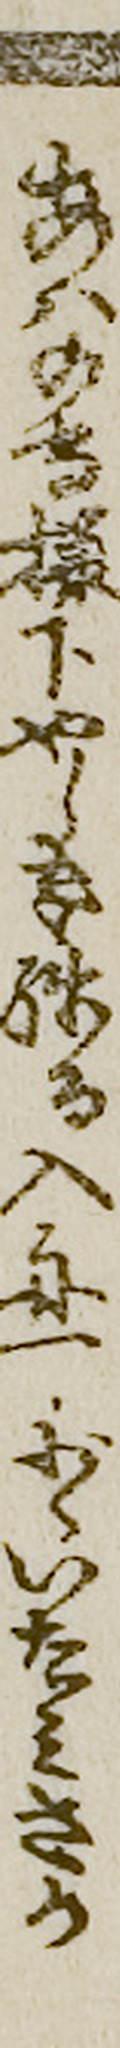あはの守様下やしき残る入舟丁少々いたみさか
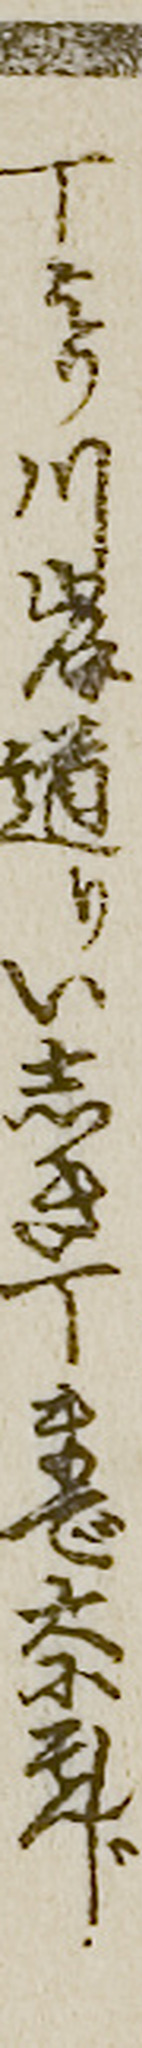丁より川岸通りいしき丁まで大にそんじ
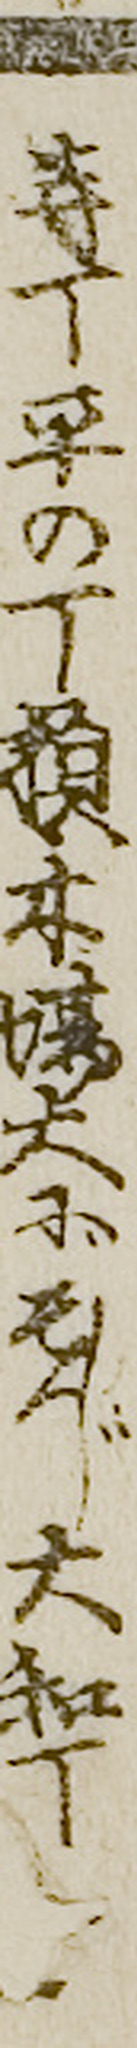寺丁平の丁損木場大にそんじ大和丁
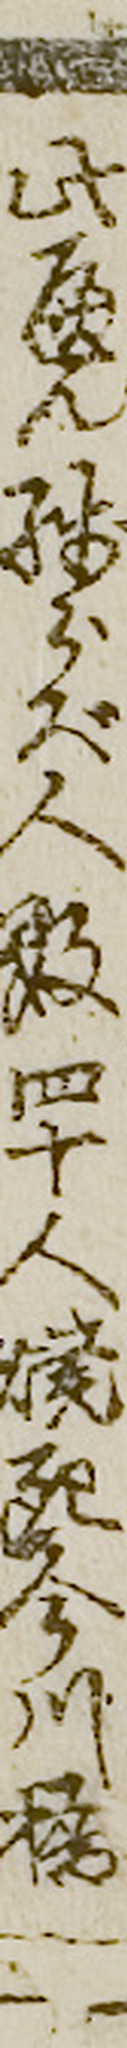此へん残らず人数四十人焼死今川橋
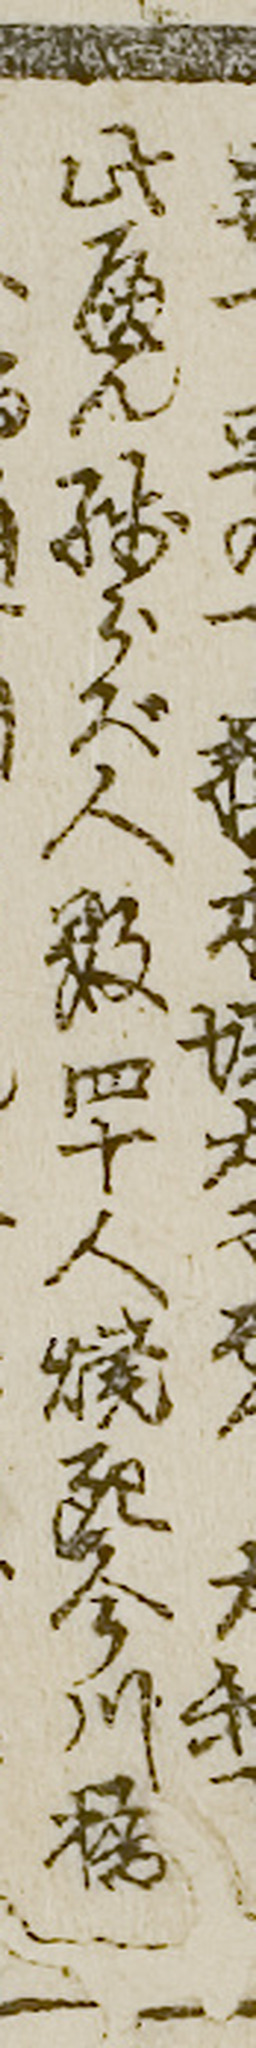此へん残らず人数四十人焼死今川橋
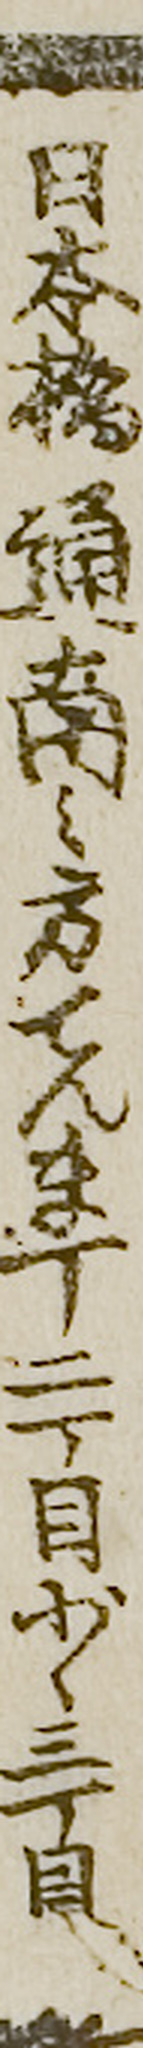日本橋通南之方てんま丁二丁目少々三丁目
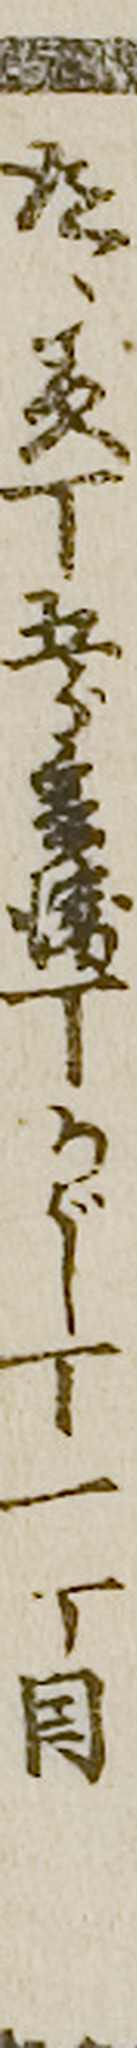たゝみ丁五郎兵衛丁かじ丁一丁目
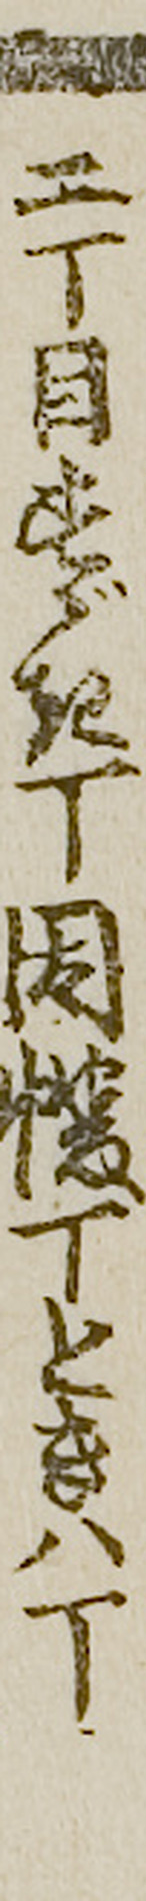二丁目すゞき丁因幡丁ときは丁
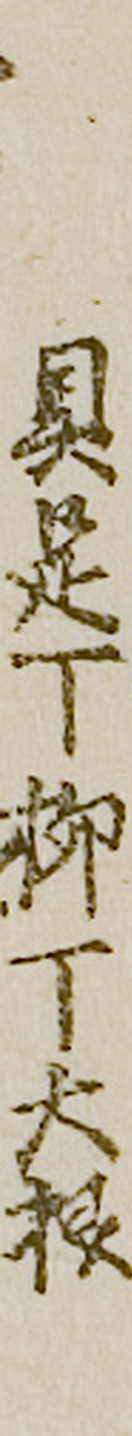具足丁柳丁大根
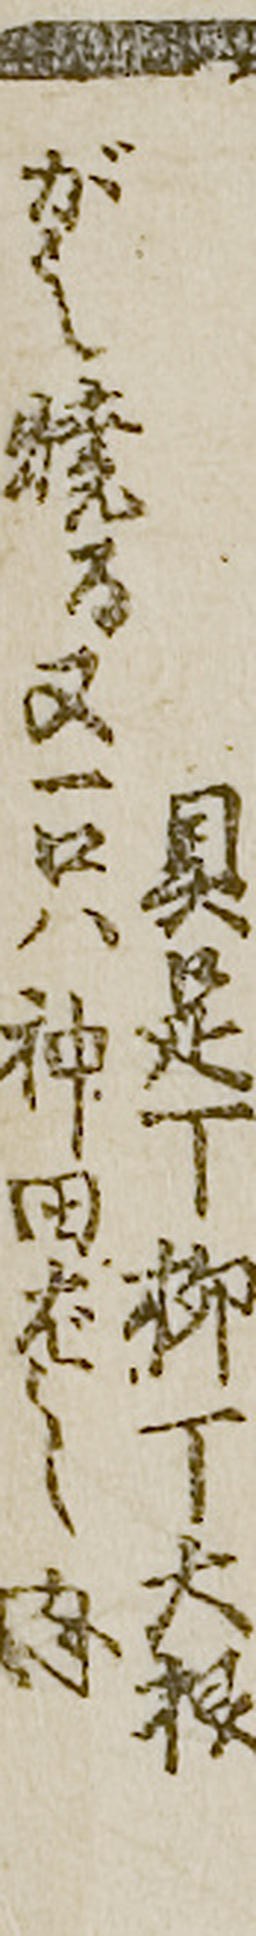がし焼る又一口は神田ばし内

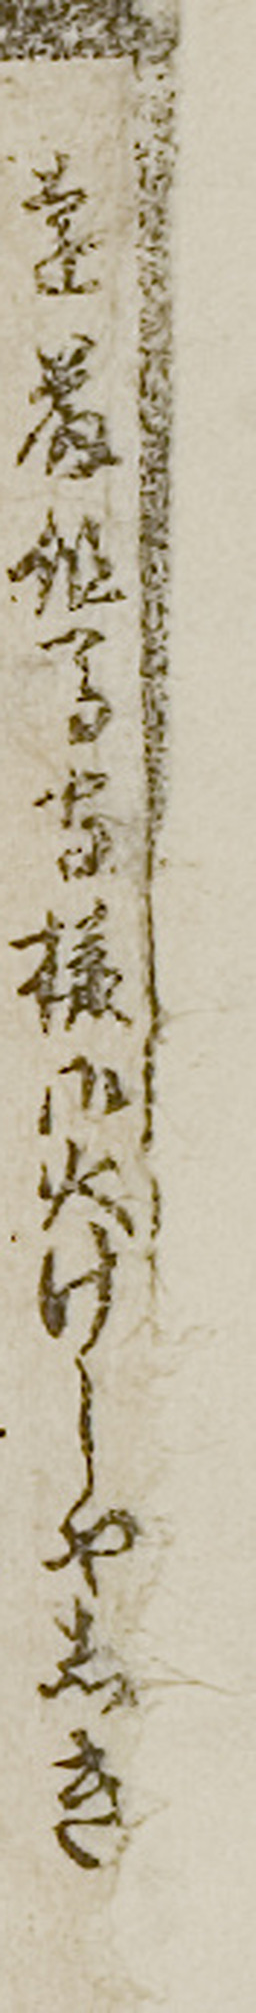遠藤但馬守様御火けしやしき
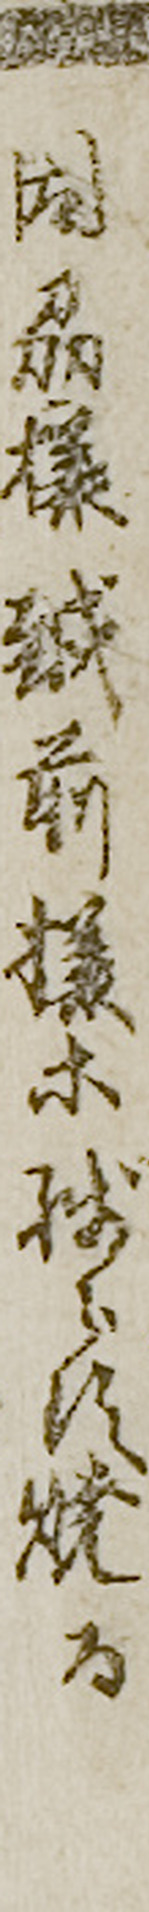因州様越前様等残らず焼る
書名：江戸大地震出火場所附
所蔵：東京大学総合図書館 General Library in the University of Tokyo, JAPAN
